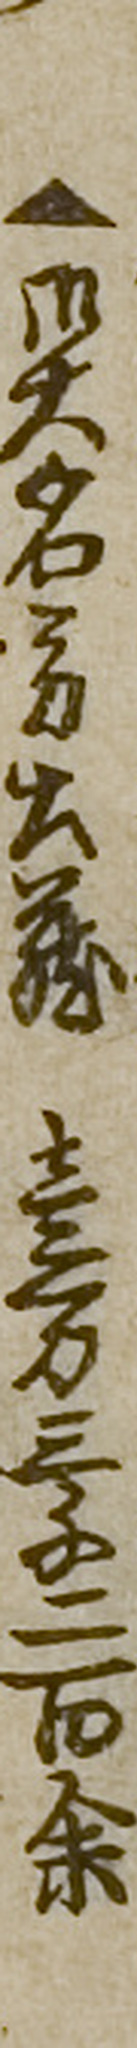▲御大名方土蔵壱万三千二百余
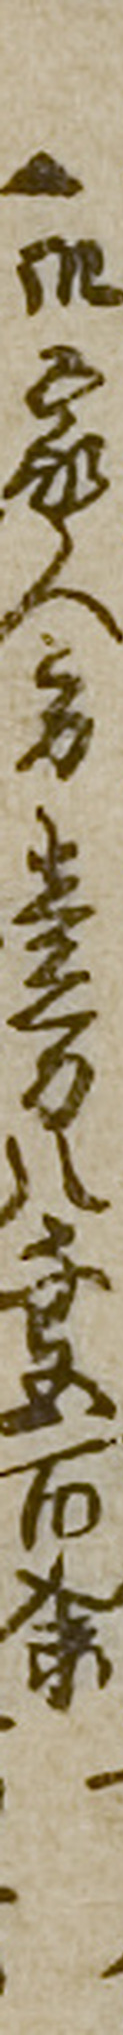▲御家人方壱万八千五百余
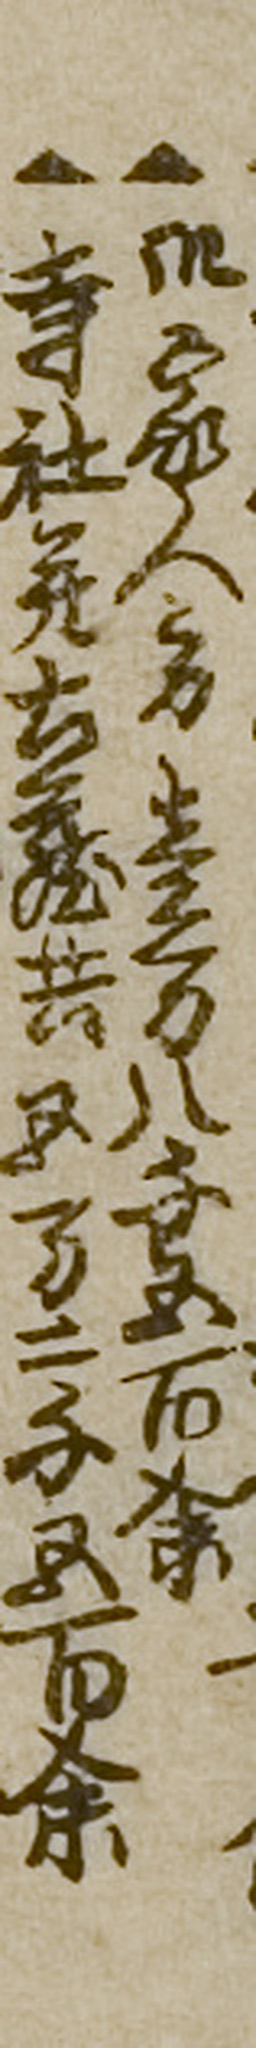▲寺社幷土蔵共五万二千五百余
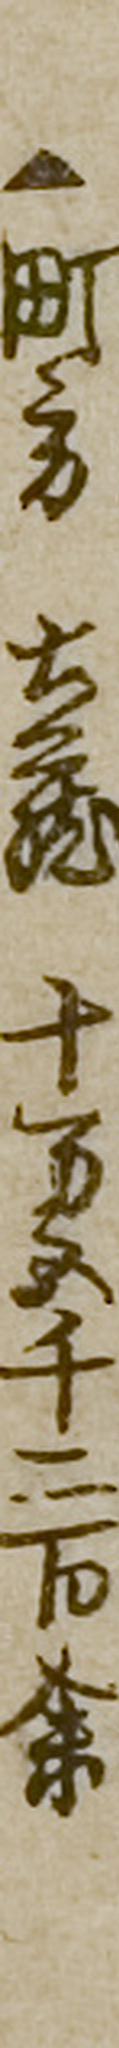▲町方土蔵十万五千二百余
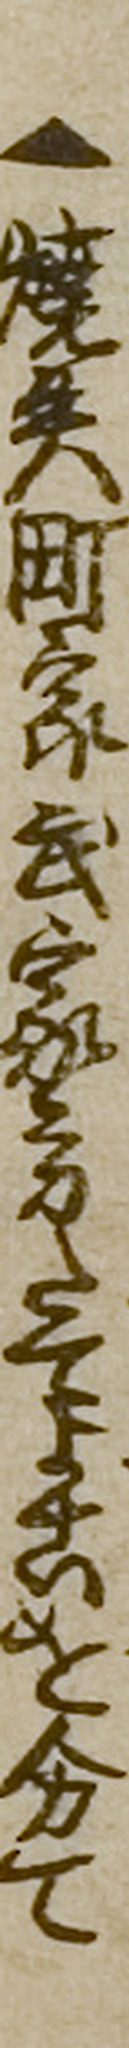▲焼失町家武家方たてよこを分て
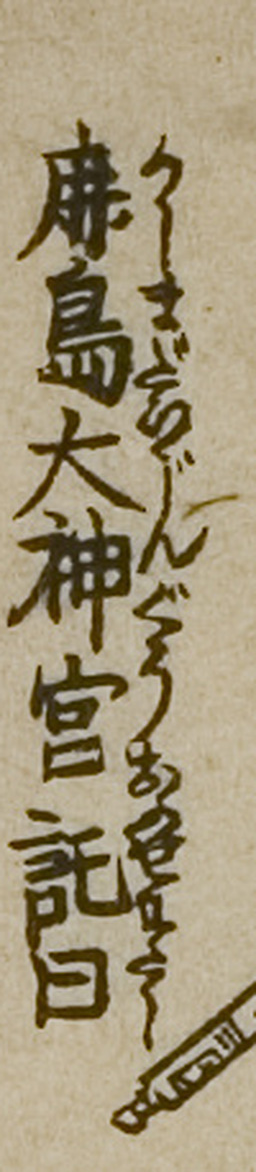鹿島大神宮託曰
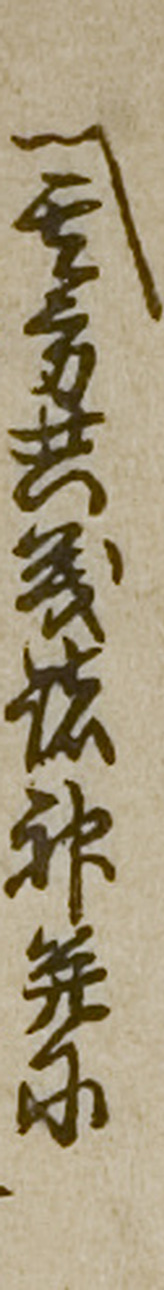〽其方共義諸神幷に
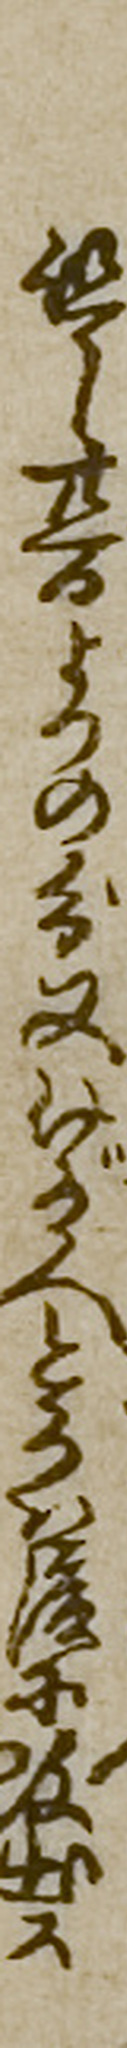但し廿一日よりの分又けが人とうは後に改出す
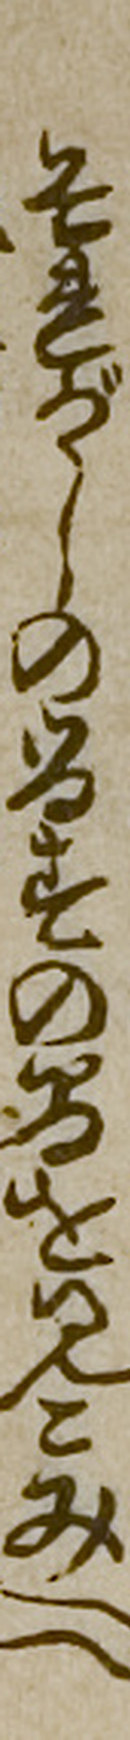それがしのるすの間を見こみ
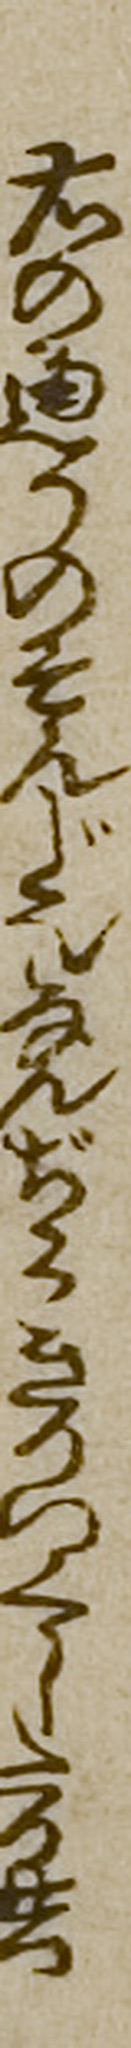右の通りのそんじ也なんじらきりつくしたる共
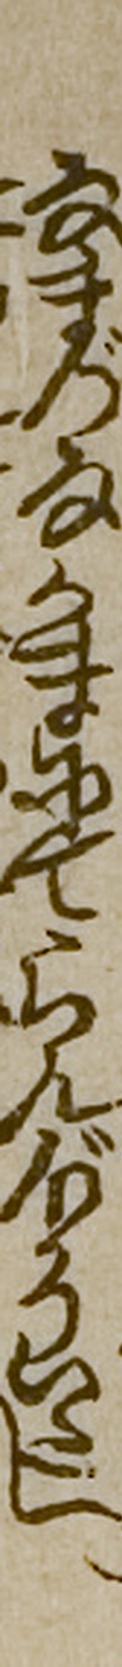なまずなかまにてらんぼういたし
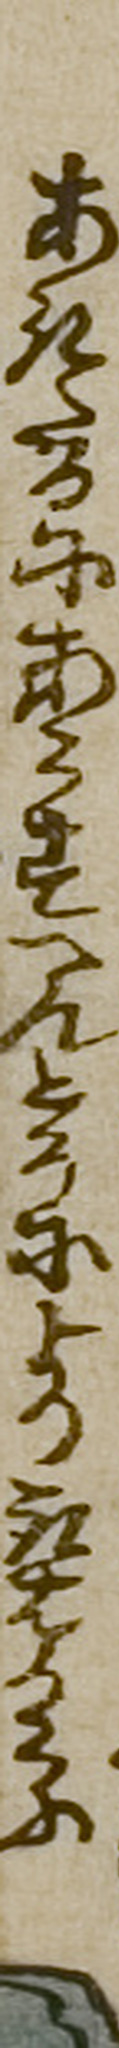あきたるにあらすへんとうにより取はからふ
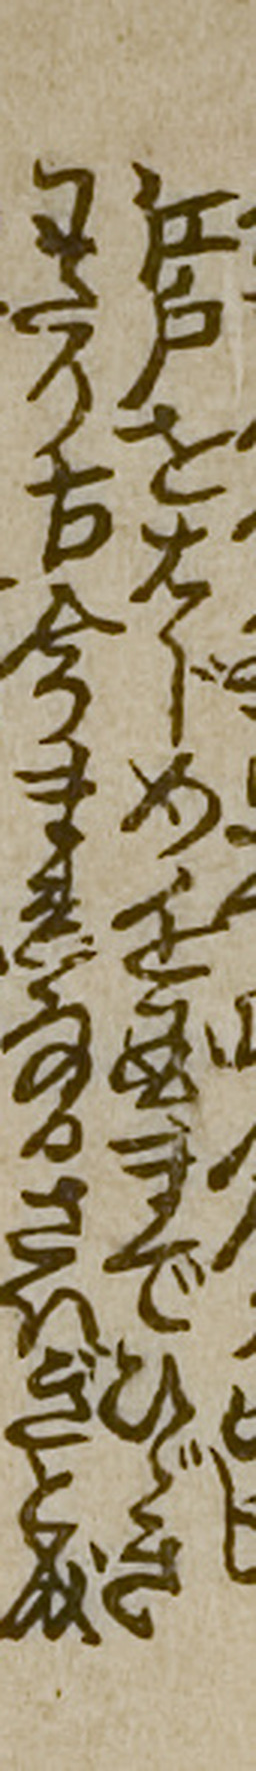わたり古今まれなるさはぎと成
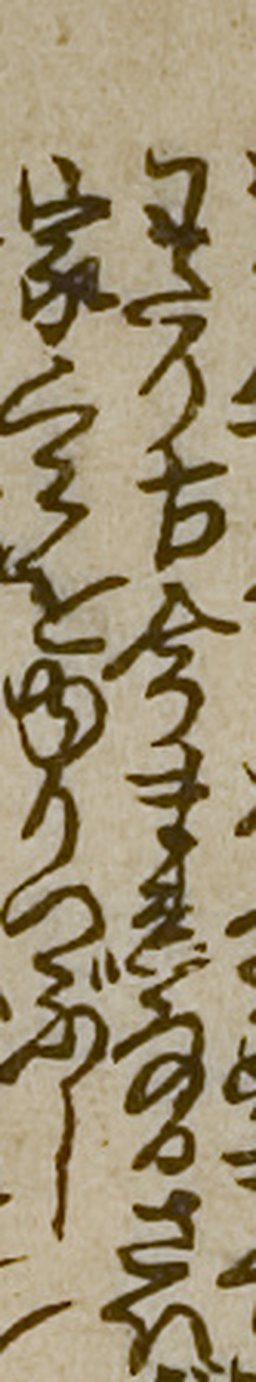家くらをゆりつぶし
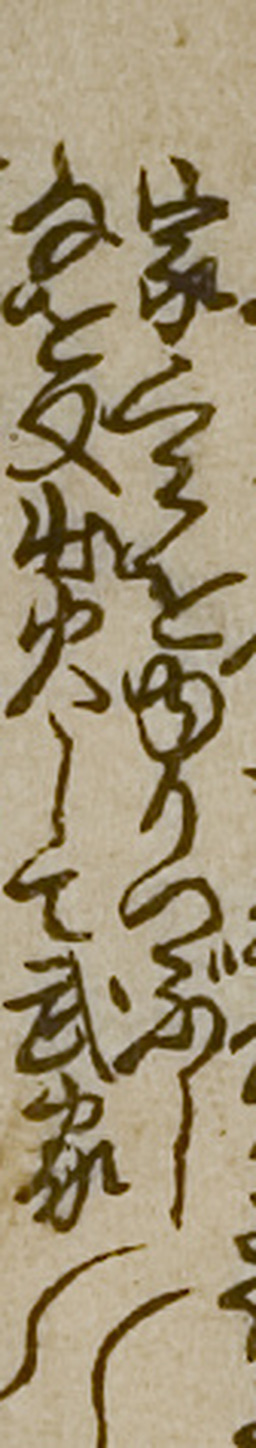なを又出火して武家
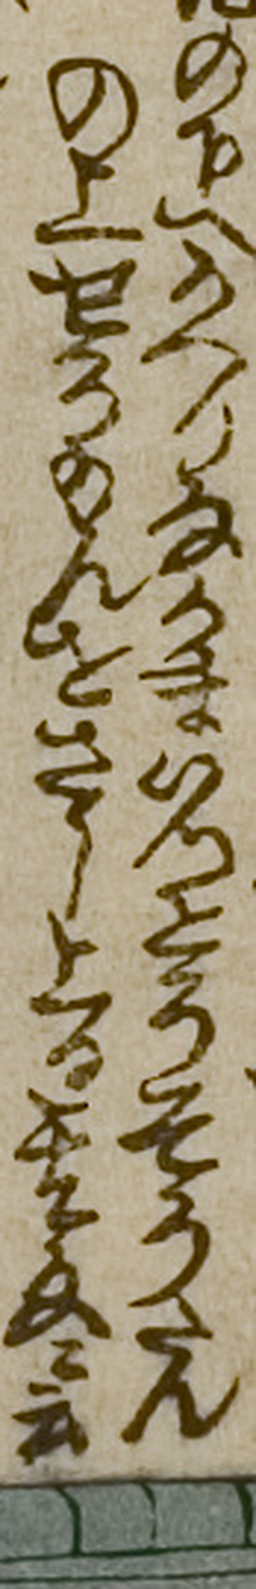の上せうもんをさし上る其文に云
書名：鹿島大神宮託曰
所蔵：東京大学総合図書館 General Library in the University of Tokyo, JAPAN
